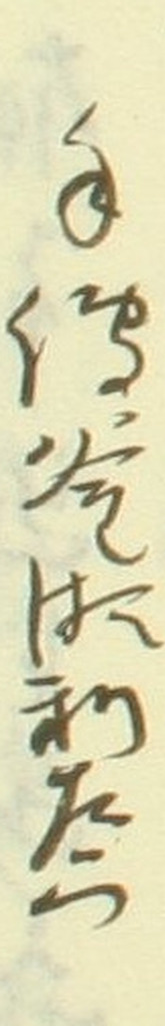手伝釜瀬利左衛門
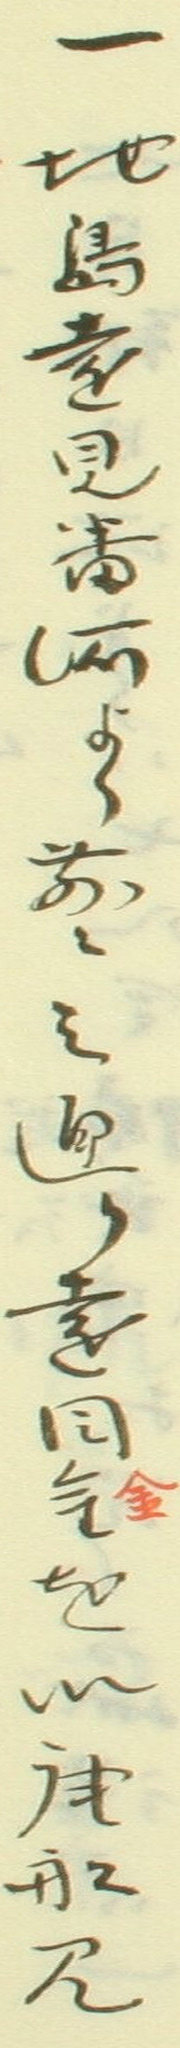一地島遠見番何より前々之通り遠見金を以唐船見
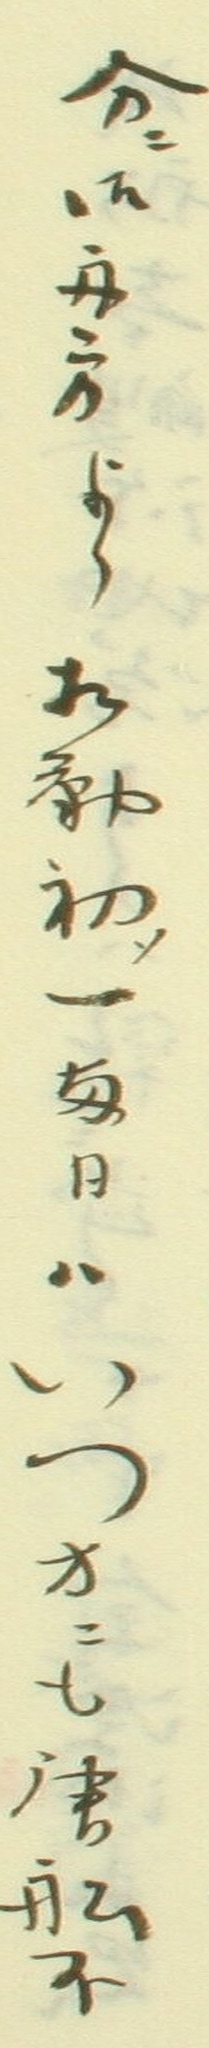分に御舟方より相勤初め一両日はいつ方にも唐船不
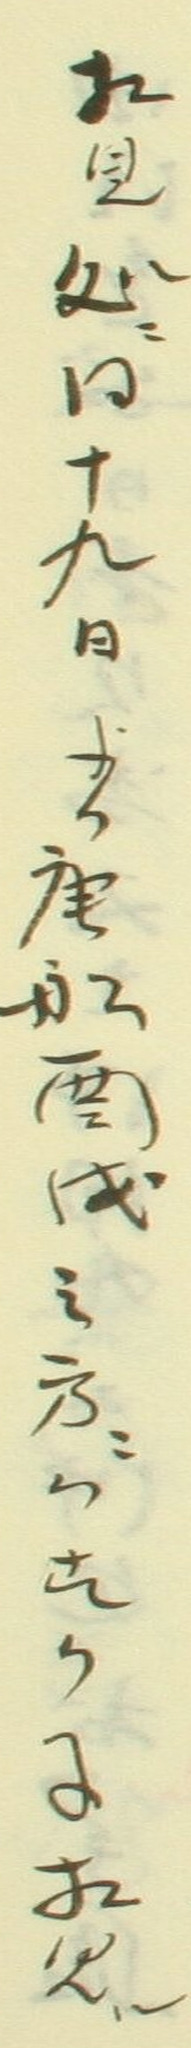相見処に同十九日より唐船酉戌之方に而走りに相見る

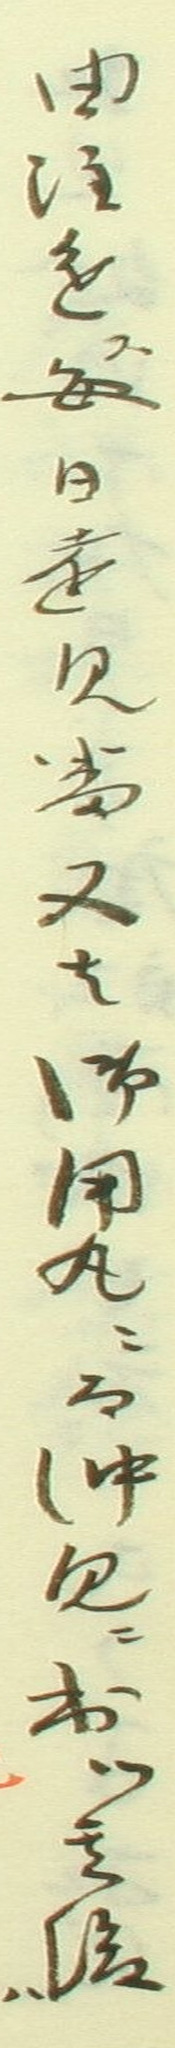由注進す毎日遠見番又は御用丸に而沖見に出ツ其段は
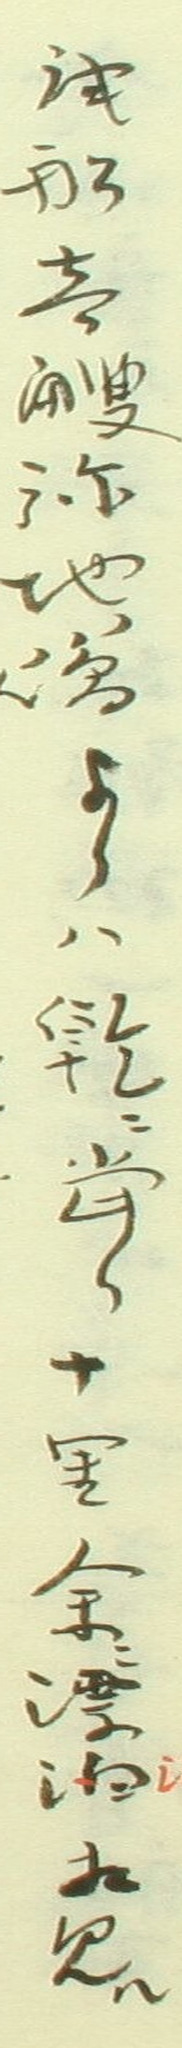試船一艘弥地の嶋よりは乾に当り十里余に漂泊相見る
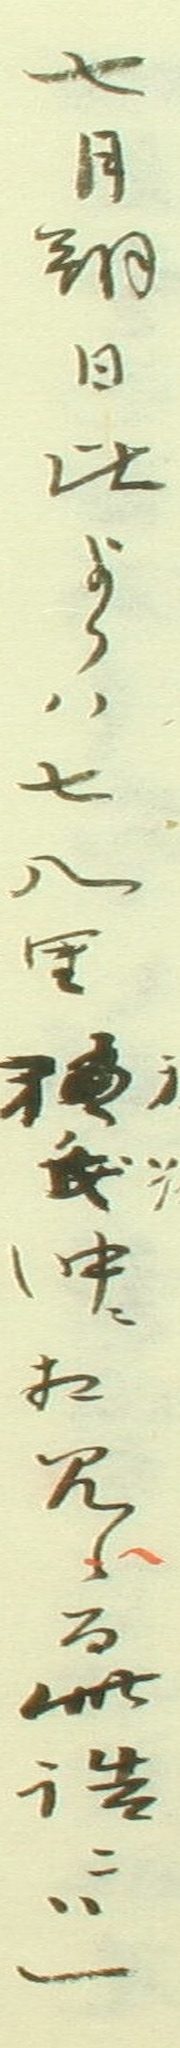七月朔日頃よりは七八里？？沖に見？る此詰には一
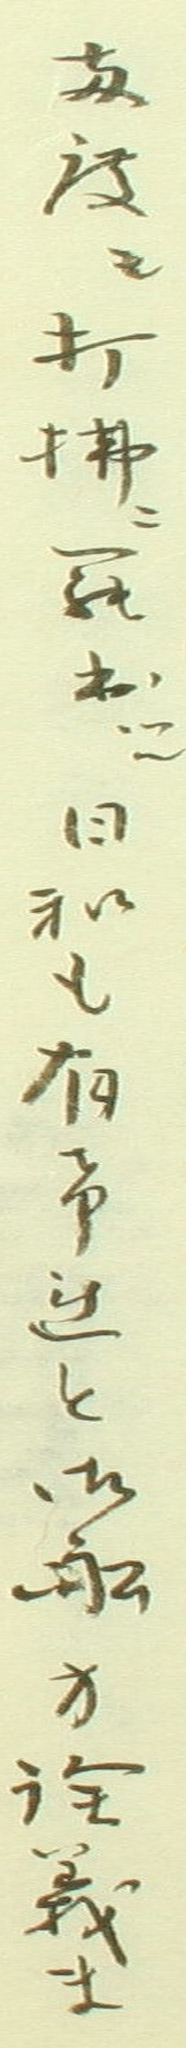両度も打払に罷出ツ也日和も有けれと御船方詮義ま
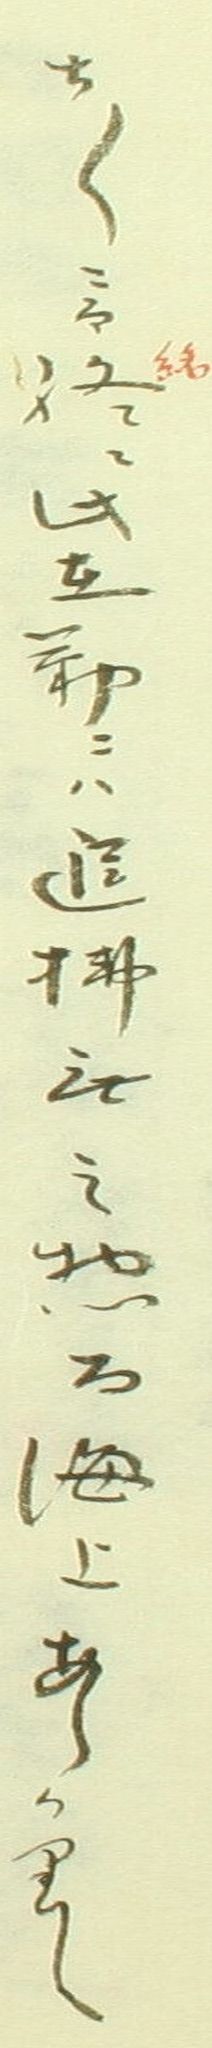ちまちに而終に此在勤には追払無之惣而海上あしかりし
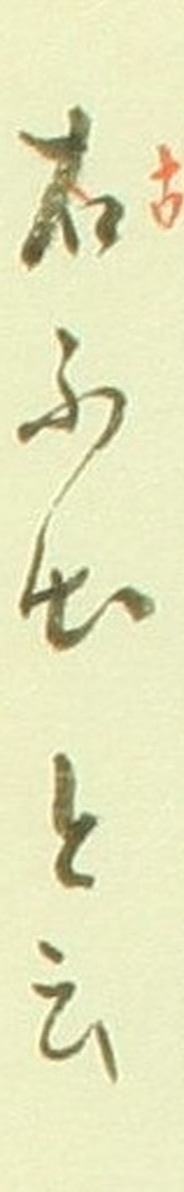右不出と云
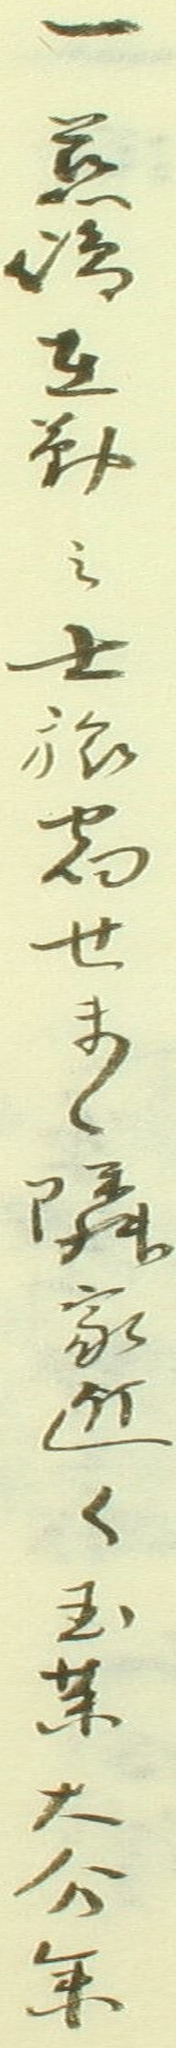一慈嶋在勤之士旅宿せまく隣家近く玉薬大分参
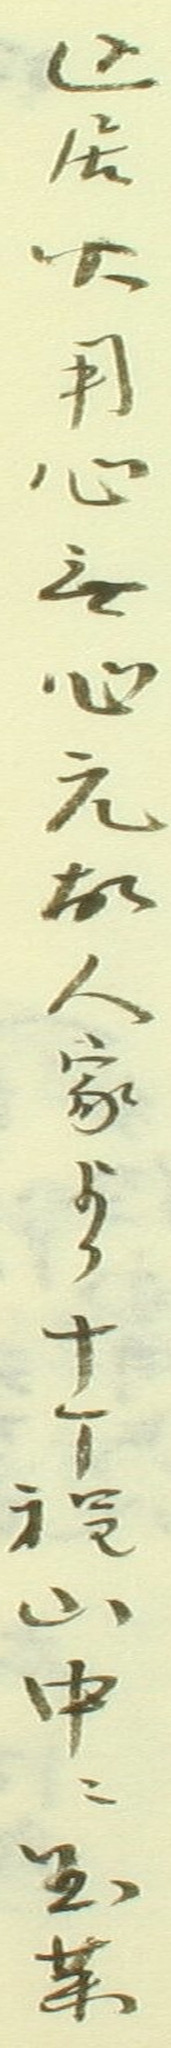込居火用心無心元故人家より十丁程山中に玉薬
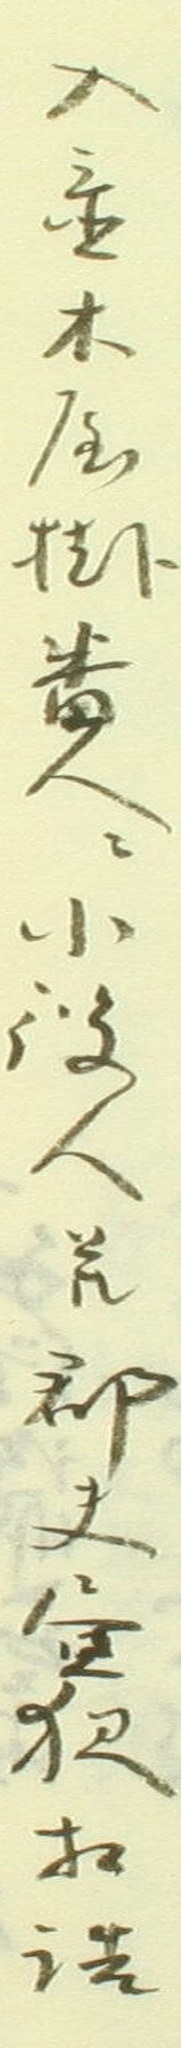入置木屋掛番人に小役人並郡夫昼夜相詰
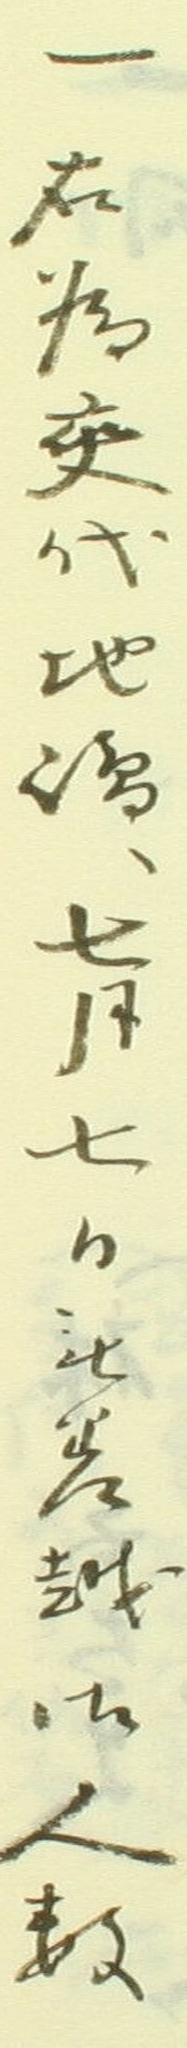一右為交代地嶋へ七月七日被差越御人数
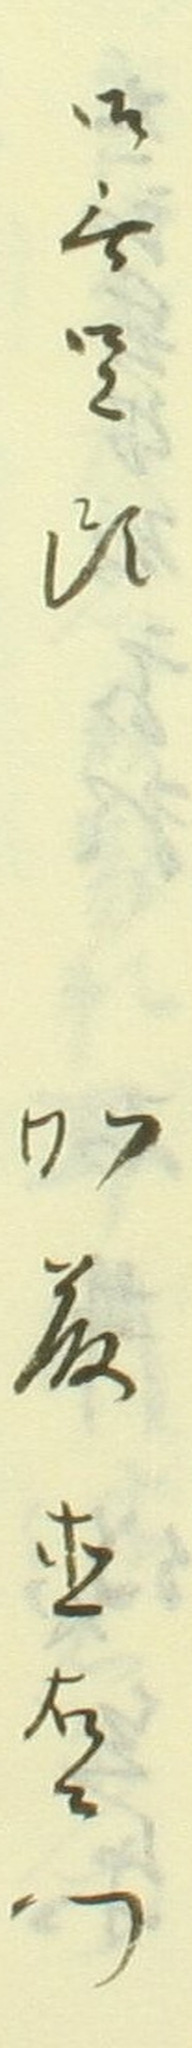御無足頭加藤直右衛門
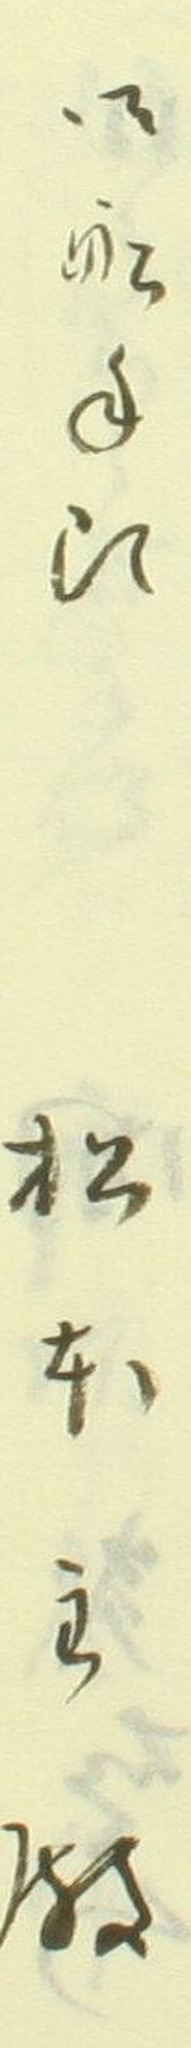御船手頭松本主殿
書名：唐船漂流記 三
